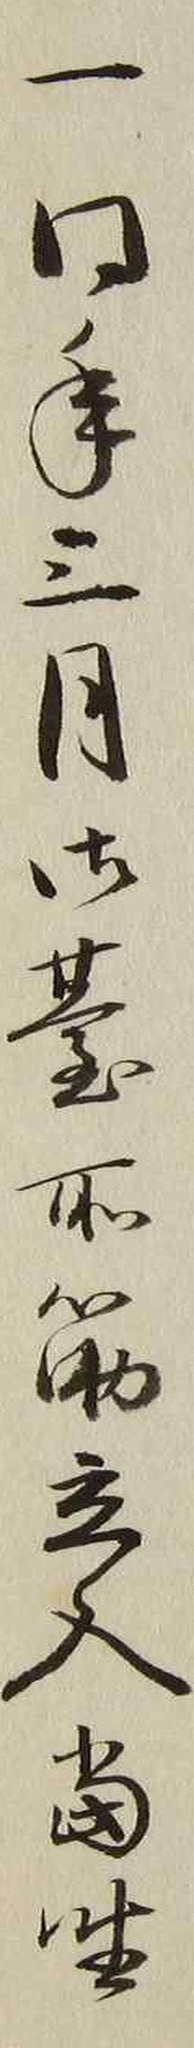一同年三月御台所筋立入当坐
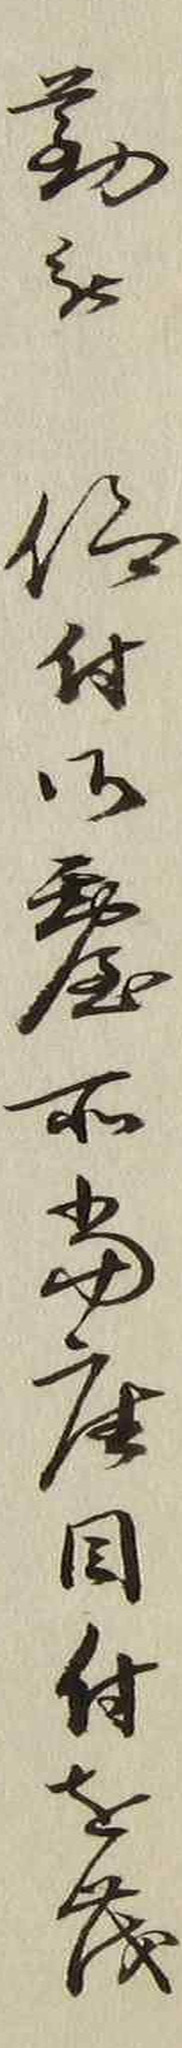勤被仰付御台所当座目付をも
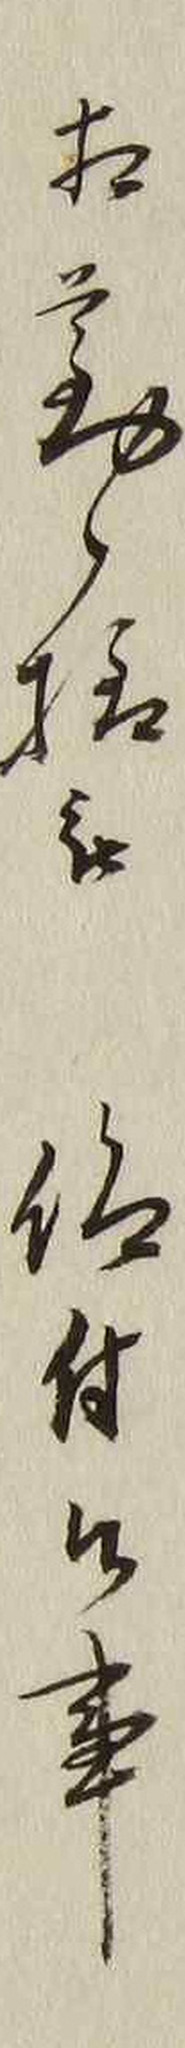相勤候様被仰付候事
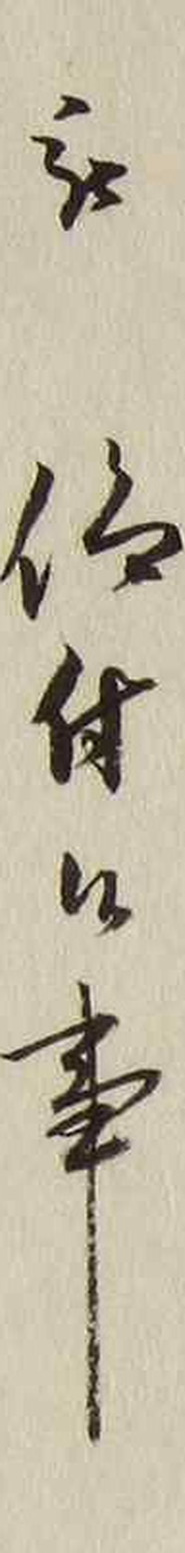被仰付候事
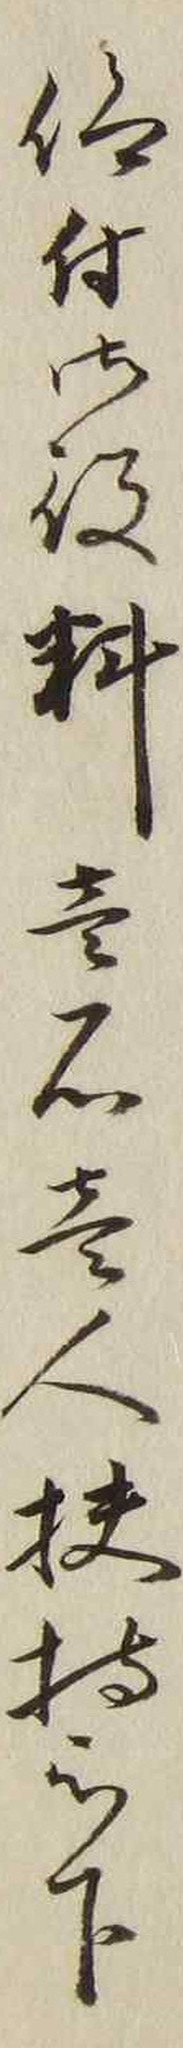仰付御役料壱石壱人扶持被下

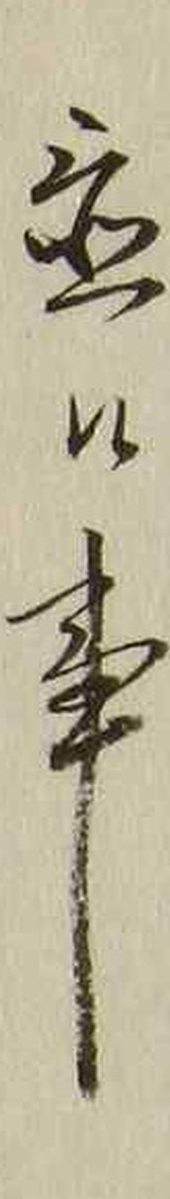置候事
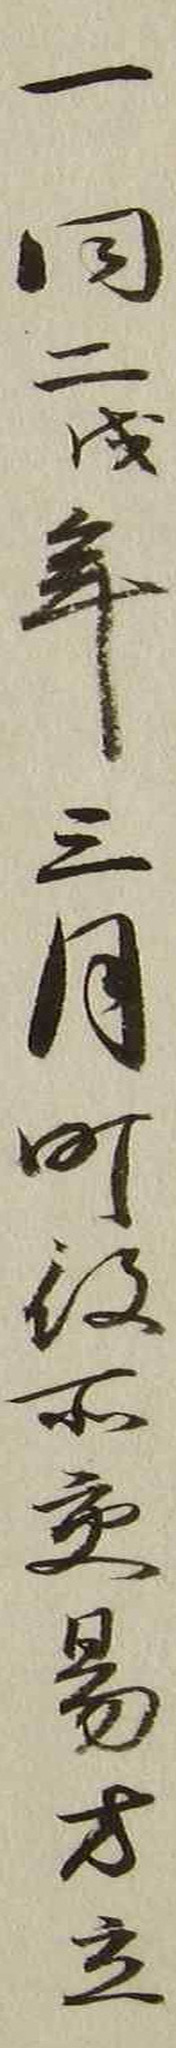一同二戌年三月町役所交易方立
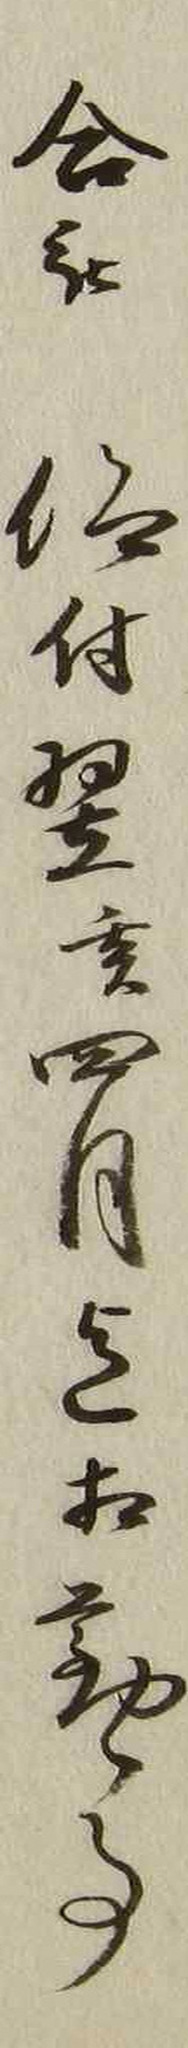合被仰付翌亥四月迄相勤候事
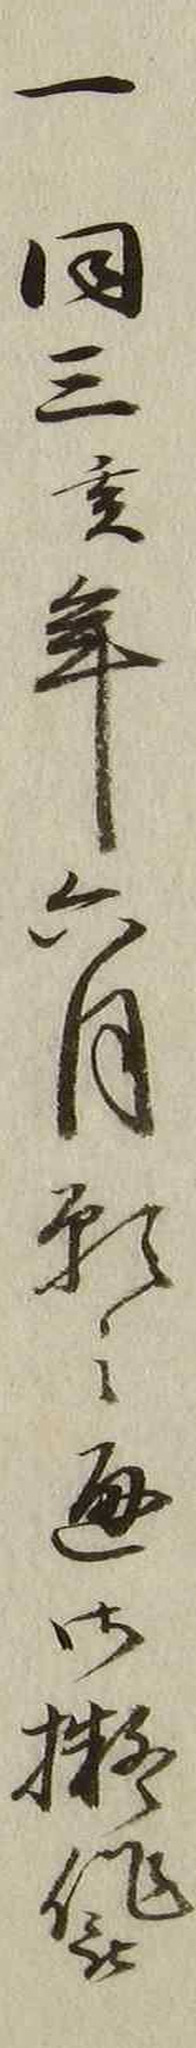一同三亥年六月願之通御擬作被
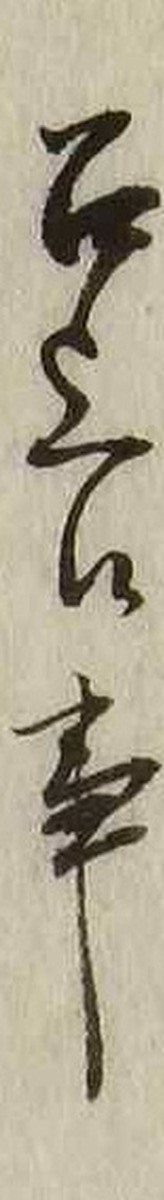召上候事
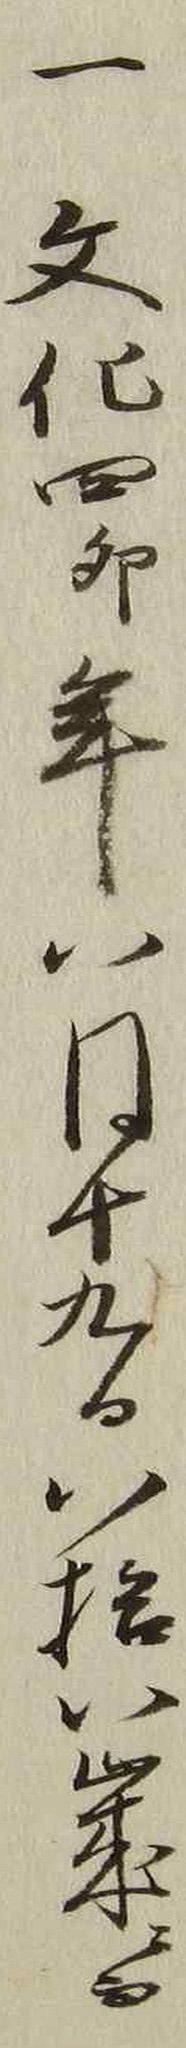一文化四卯年八月十九日八拾八歳而
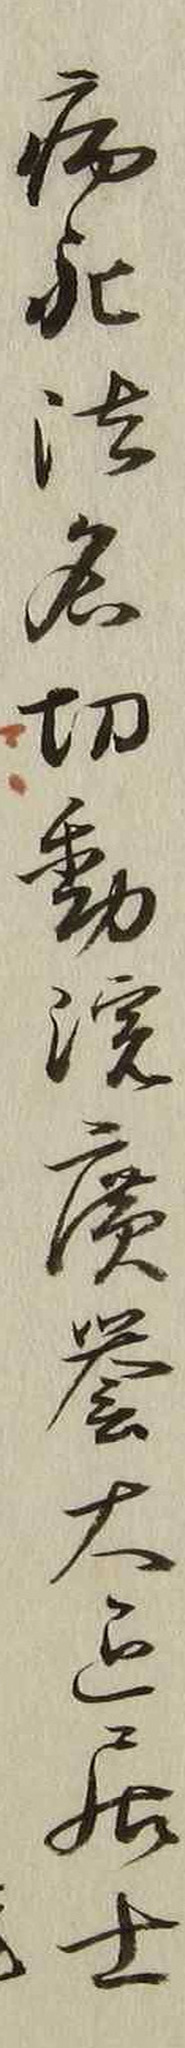病死法名切動院広誉大迎居士
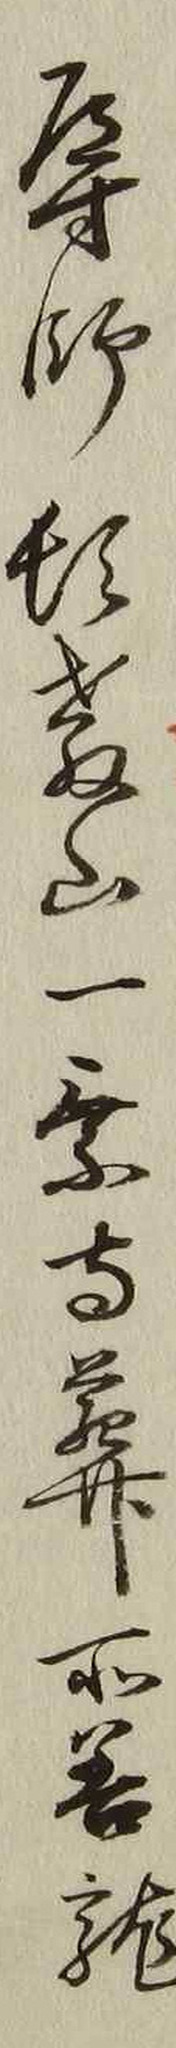導師頓教山一乗寺葬所善龍
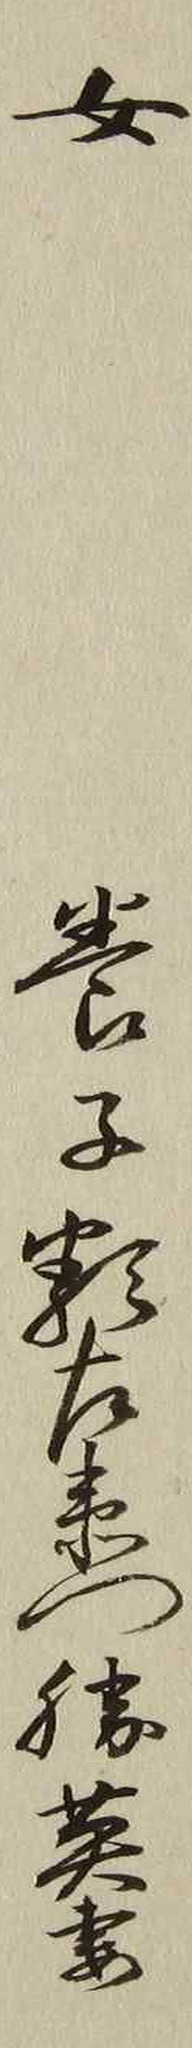女養子類左衛門勝英妻
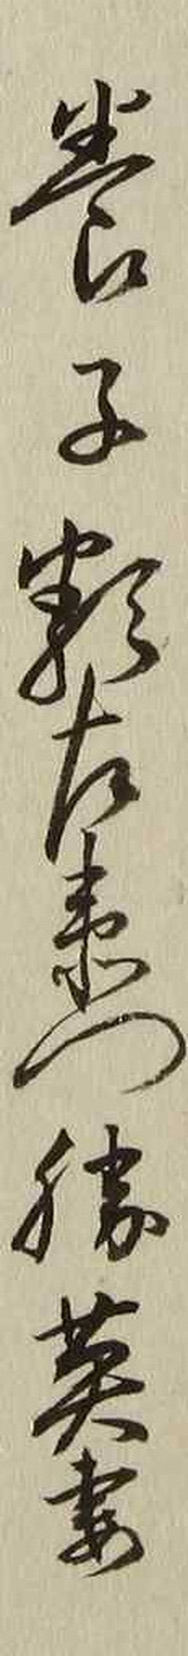女養子類左衛門勝英妻
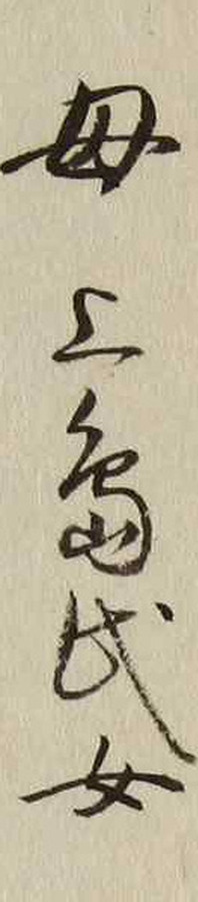母上島氏女
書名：諸士系譜　巻之102　か之部10
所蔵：会津若松市立会津図書館
